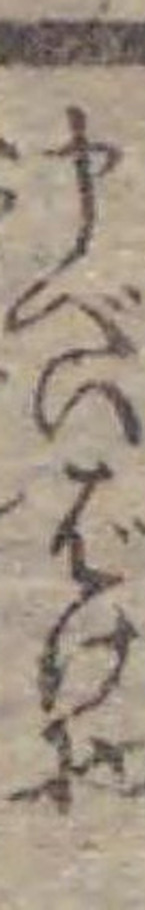申べいばけ物
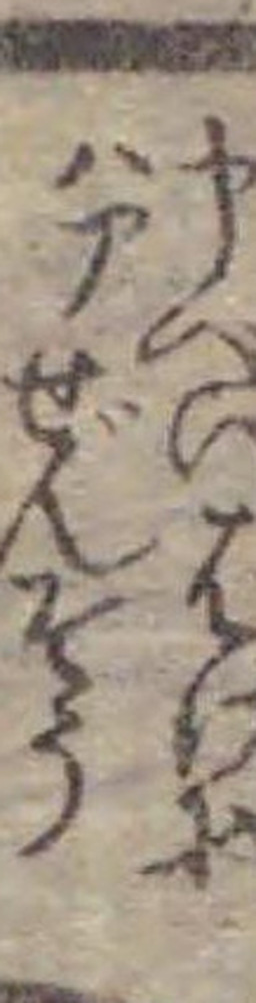ハアぜんそう
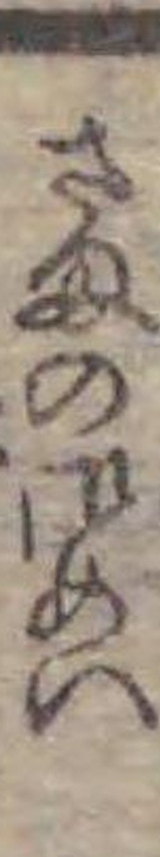さまの御めい
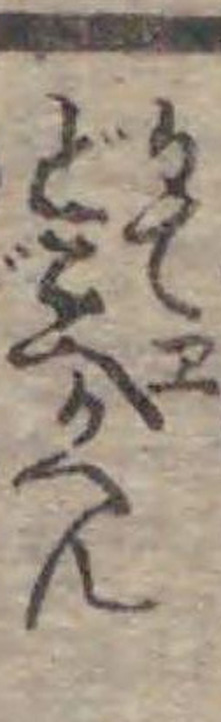どこへかへん
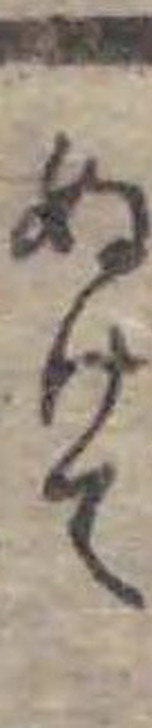ぬげて
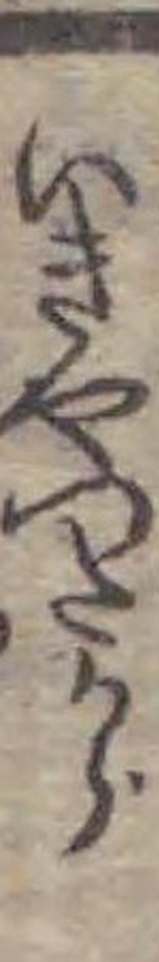いきやつたから
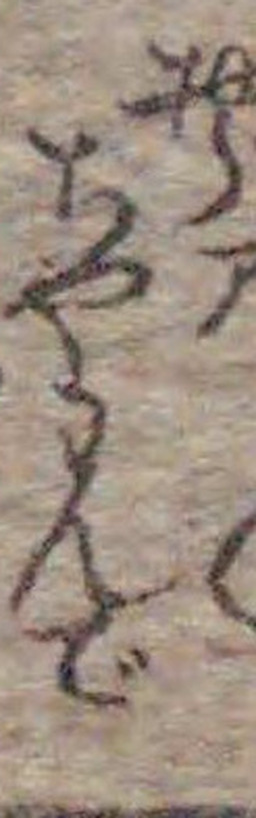ちやわんで
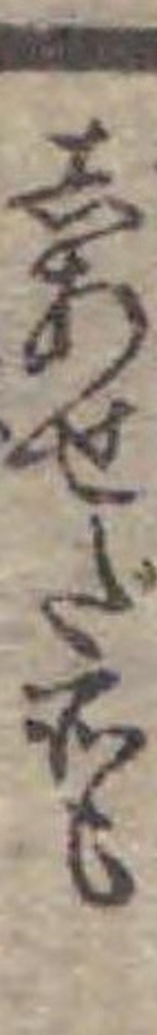しあせだ所も
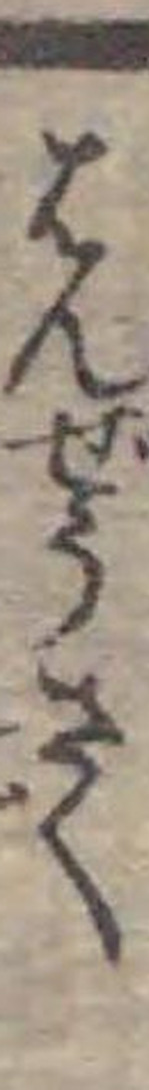はんぜうさく
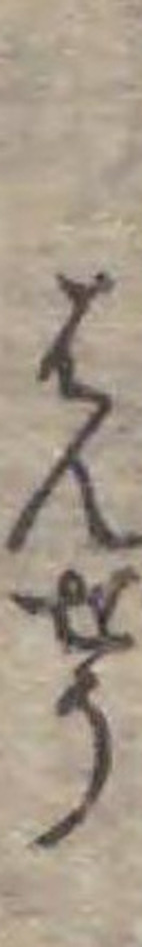はんぜう
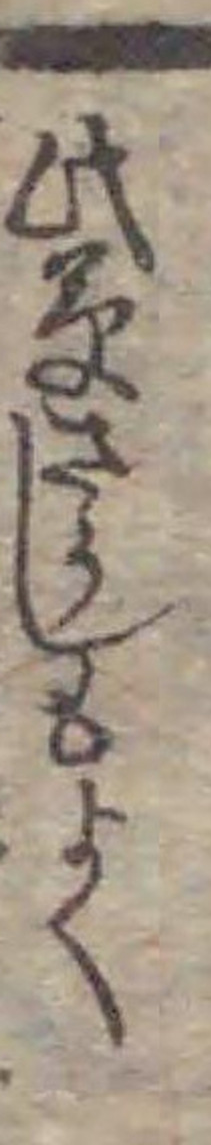此草さうしもよく
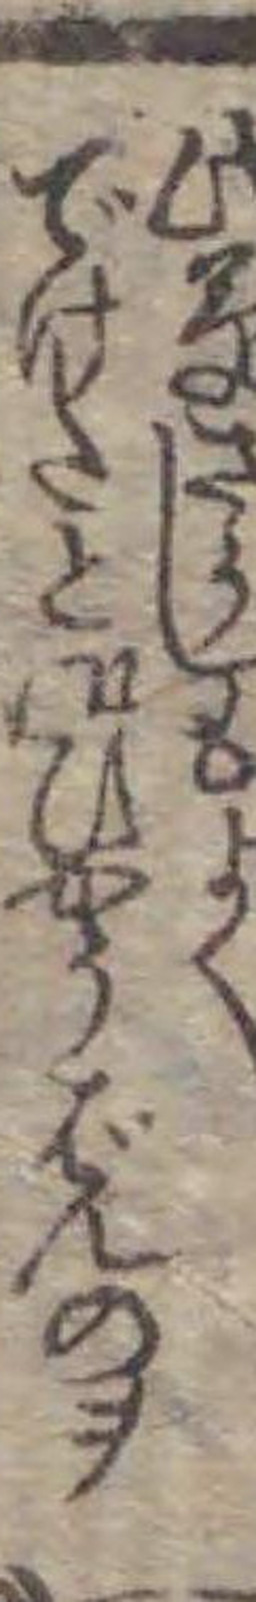でけたと御ひやうばんのヲ
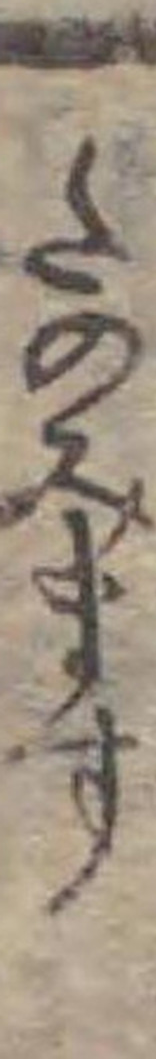たのみます
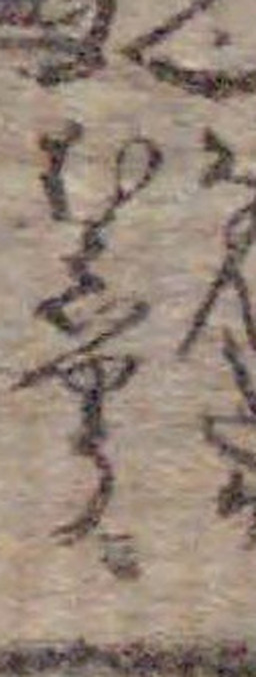むしやうに
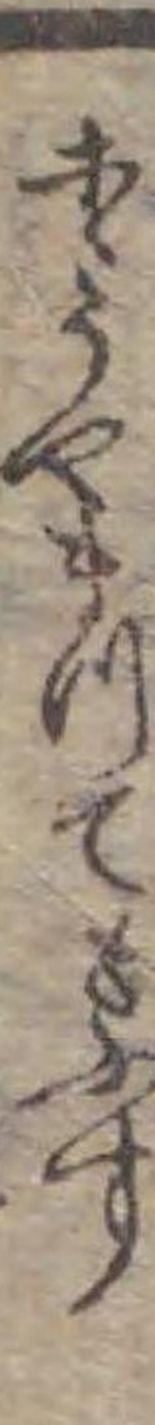等々うやまつてもふす
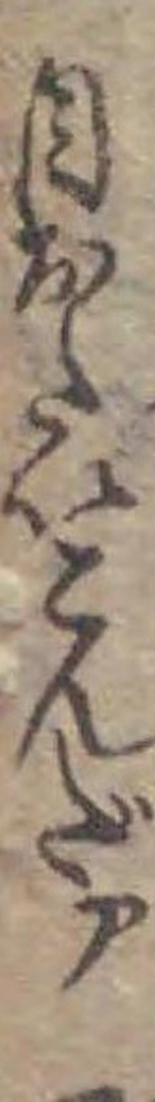目出たいこんだァ
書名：歌の化物一寺再興 : 2巻
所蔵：国立国会図書館 National Diet Library, JAPAN
